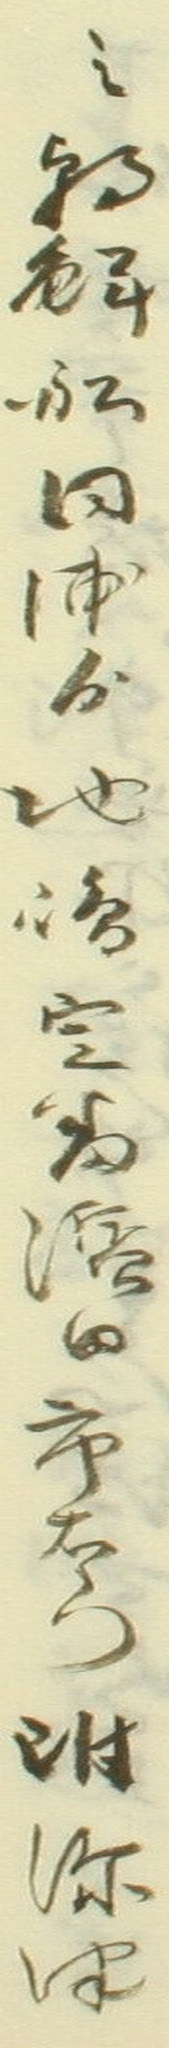之朝鮮船同浦より地島定番濱田市右衛門付添由
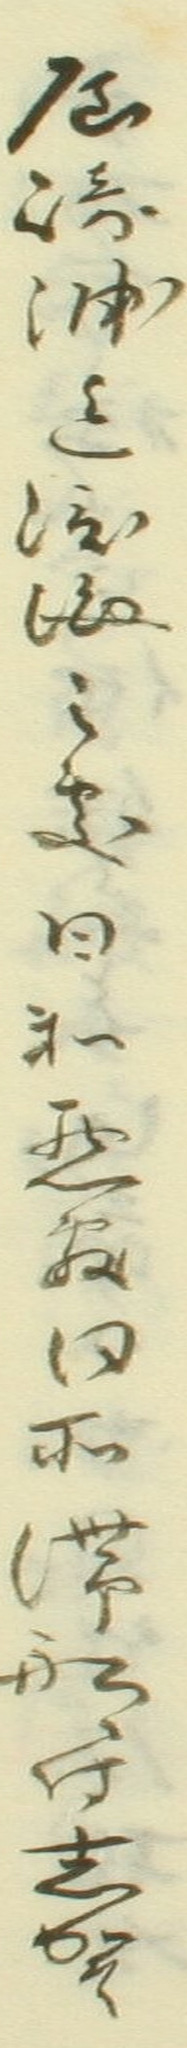屋崎浦迄渡海之処日和悪敷同所滞船に付志賀
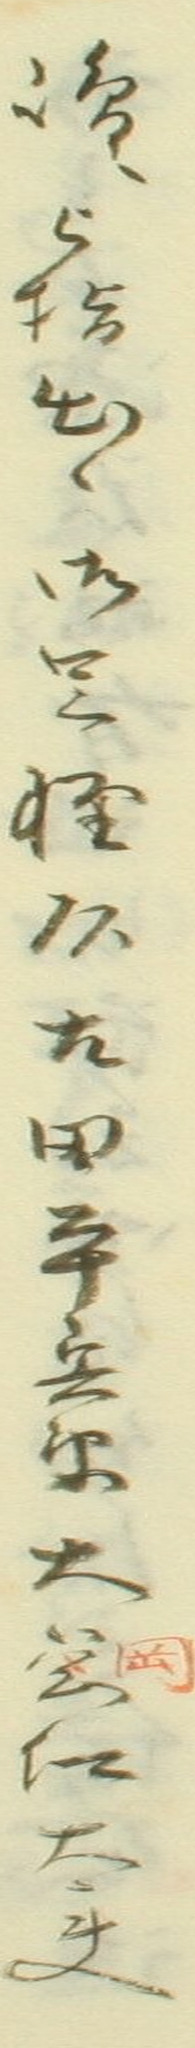島へ被指出候御足軽頭古田平兵衛大岡仁太夫
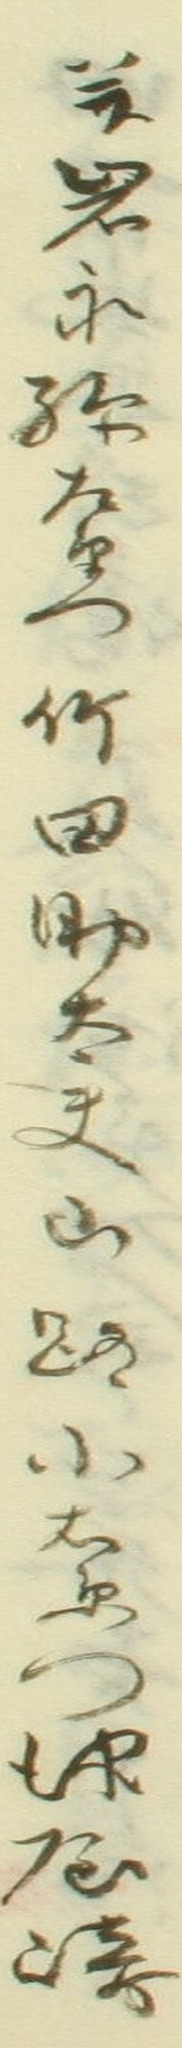并岩永孫左衛門竹田助太夫山路小右衛門沖屋崎
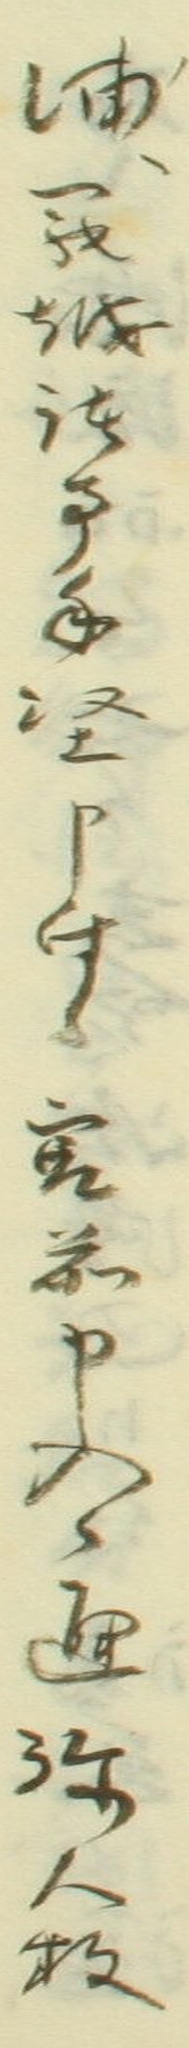浦罷越諸事手堅申付候最前申入候通弥人数
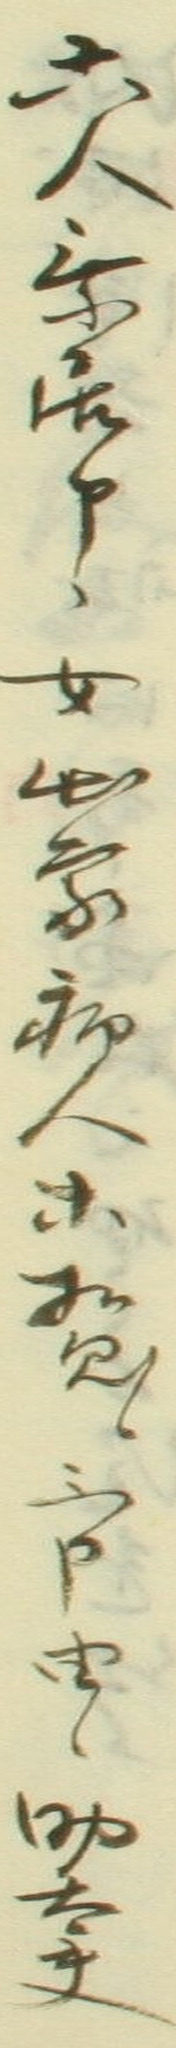六人乗居申候女出家病人未相見へ不申由候助太夫
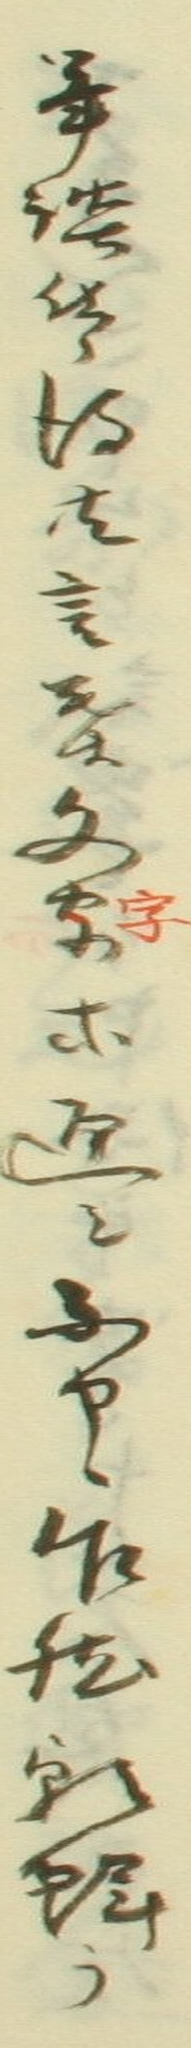筆談仕候得共言葉文等通し不申候乍然朝鮮う

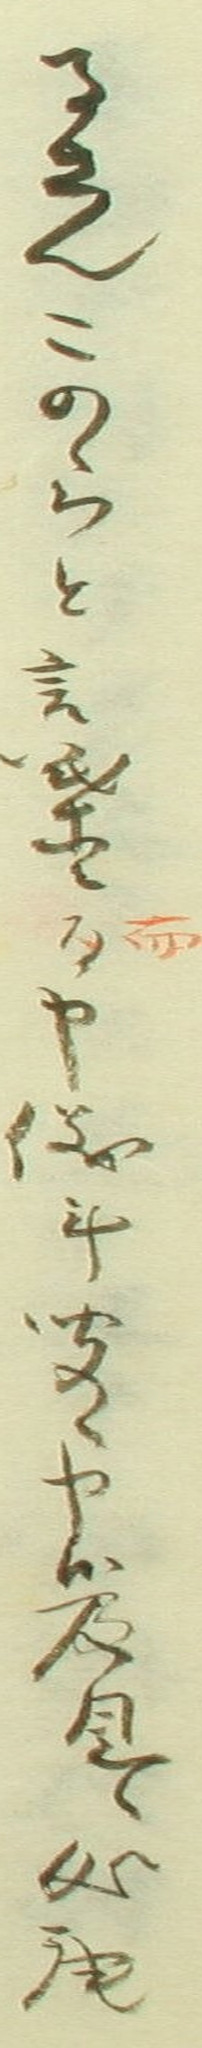るさんこのらと言葉にて申儀計聞へ申候及見候処唐
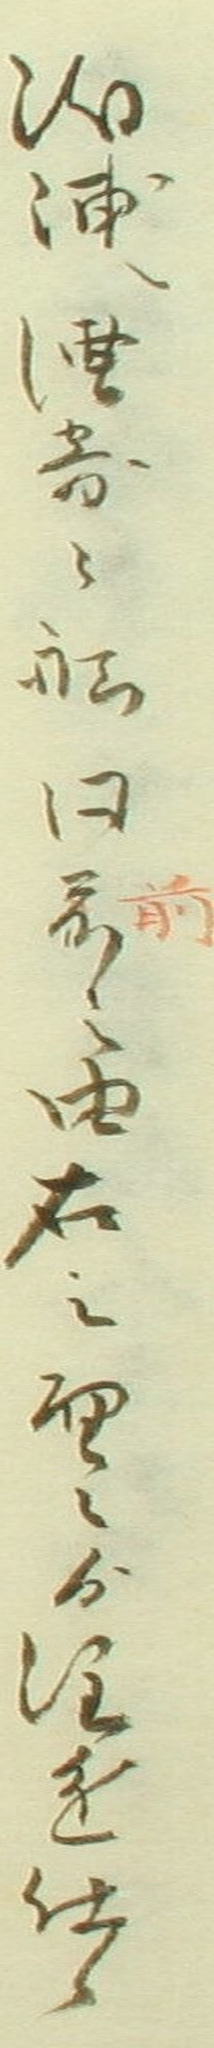泊浦へ漕寄候船同前之由右之面々より注進仕候
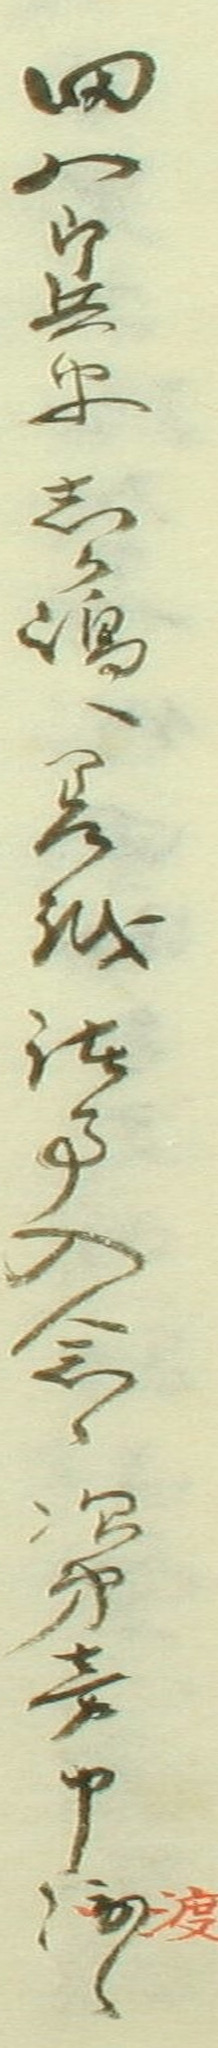田八郎兵衛志か島へ着越諸事入念候次第旁申渡候
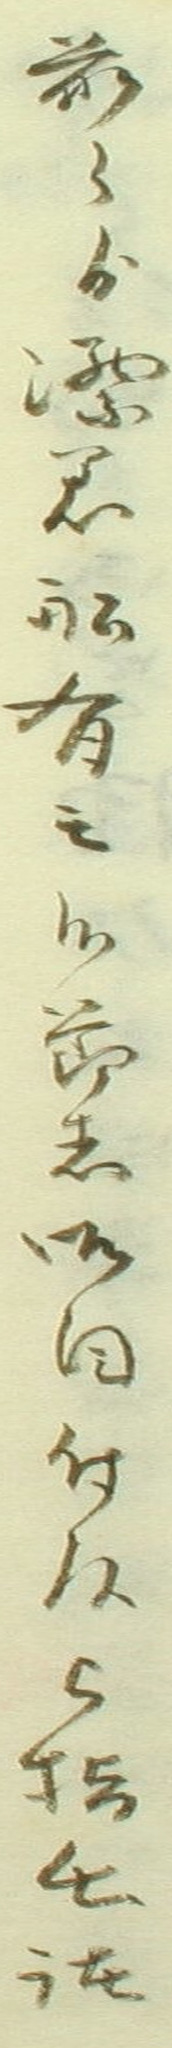前々より漂着船有之候節は御目付頭被指出諸
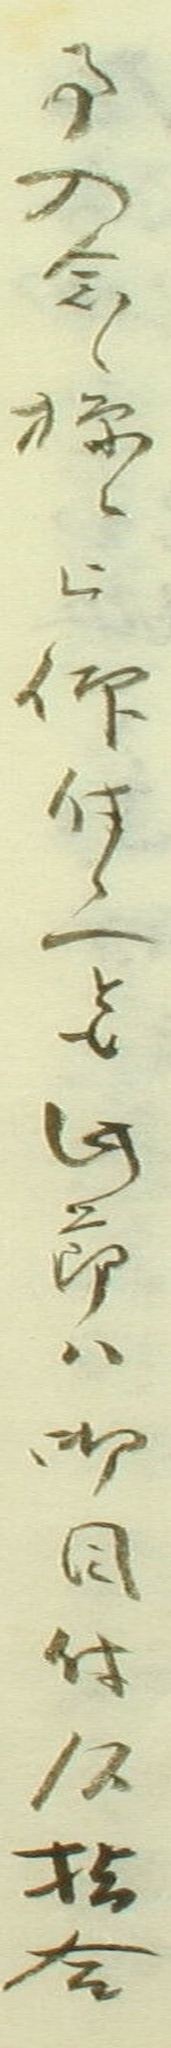事入念候様に被仰付候へとも此節は御目付頭指合
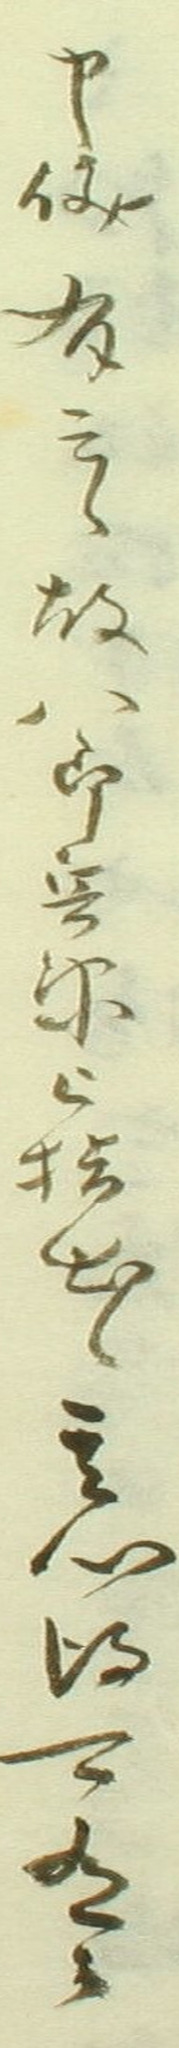申儀有之候故八郎兵衛被指出候其心得可有候
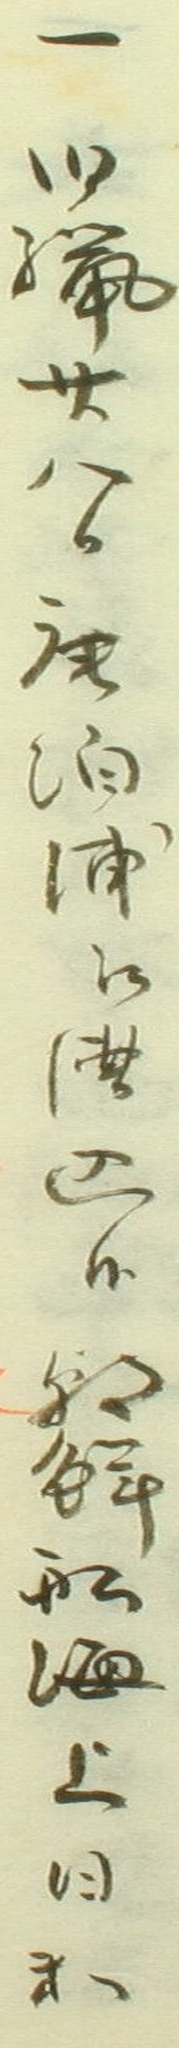一旧臘廿八日唐泊浦え漕込候朝鮮船海上日和
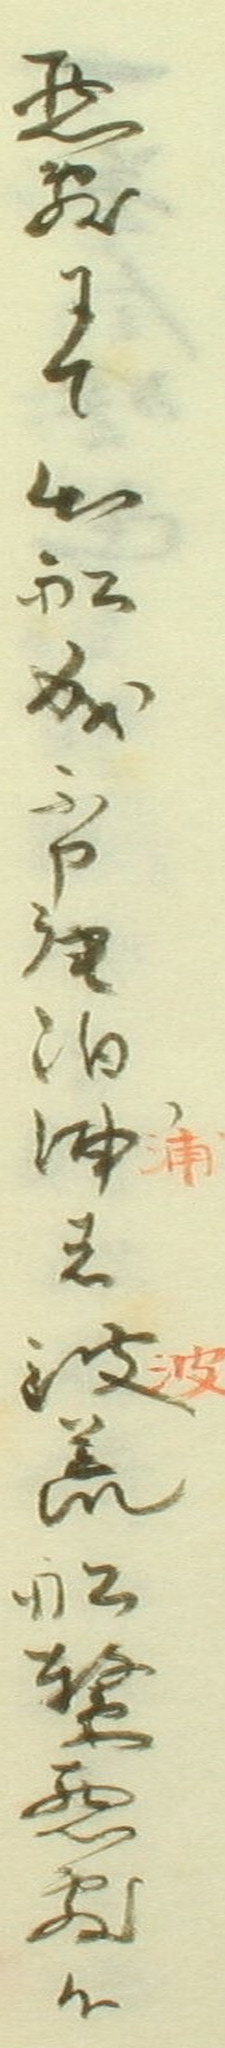悪敷にて出船成不申唐泊浦は波荒船繋悪敷候
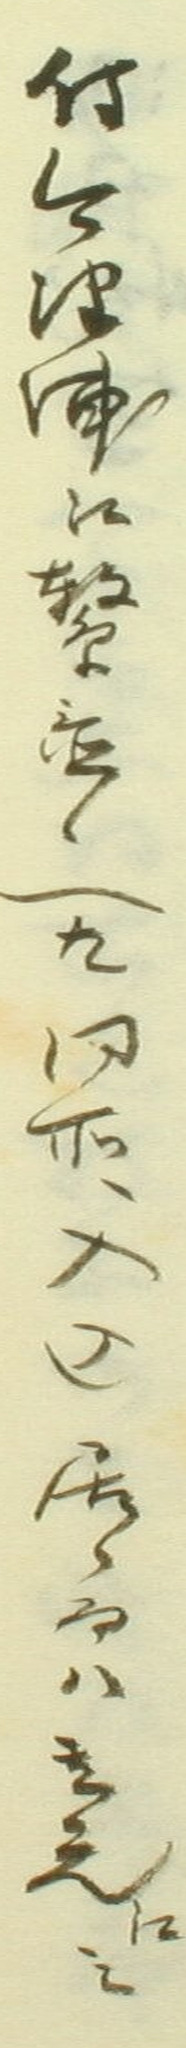付今津浦え繋置候へ共同所へ入込居候ては其元え之
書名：朝鮮船御領内漂流記 坤
